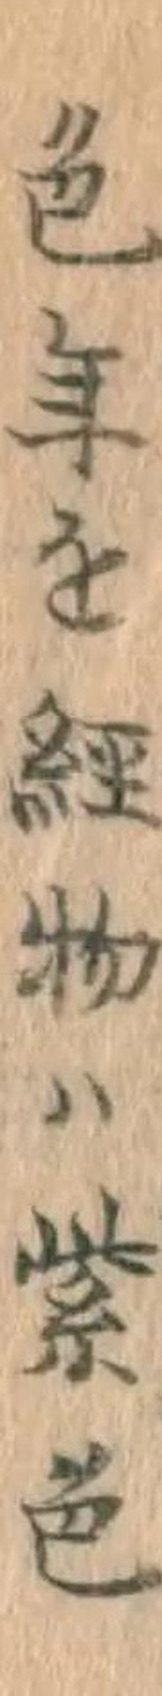色年を経物は紫色
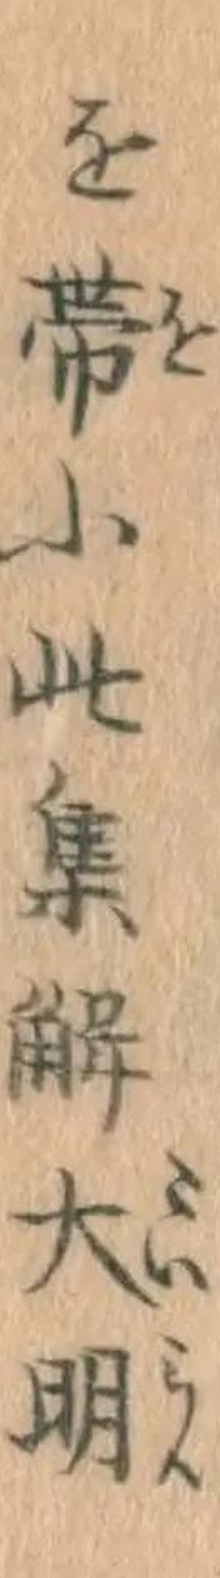を帯ふ此集解大明
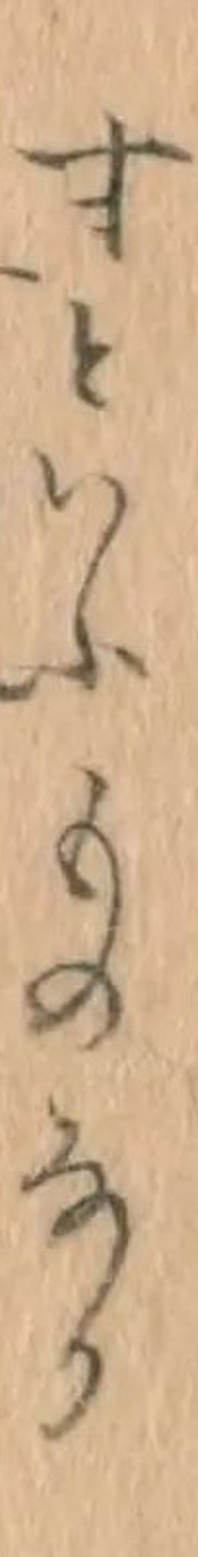寸といふものなり
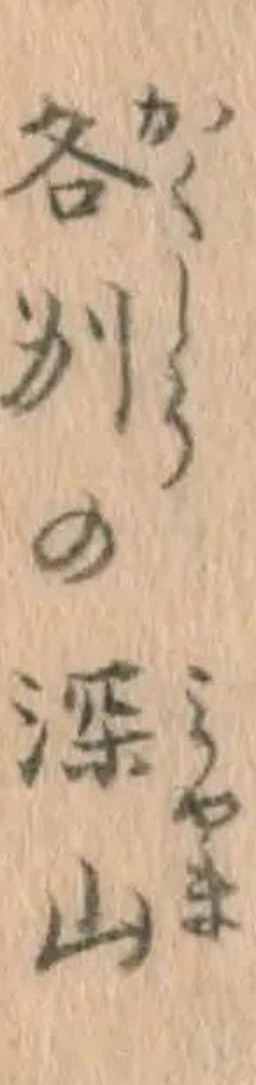各州の深山
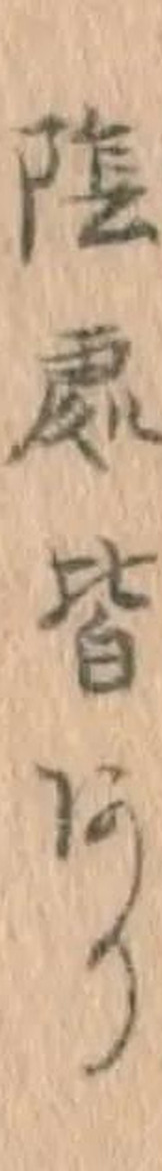陰処皆あり
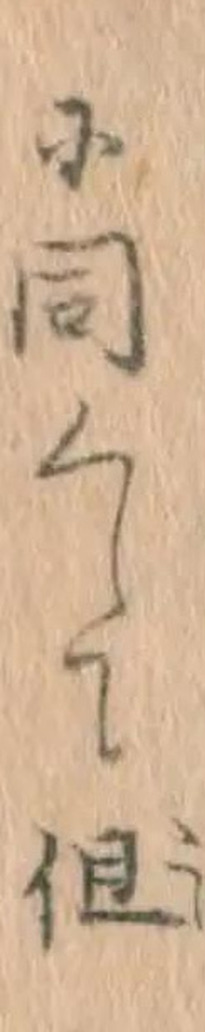に同くして但
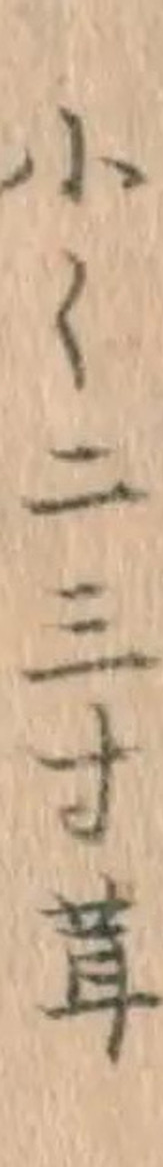小く二三寸茸

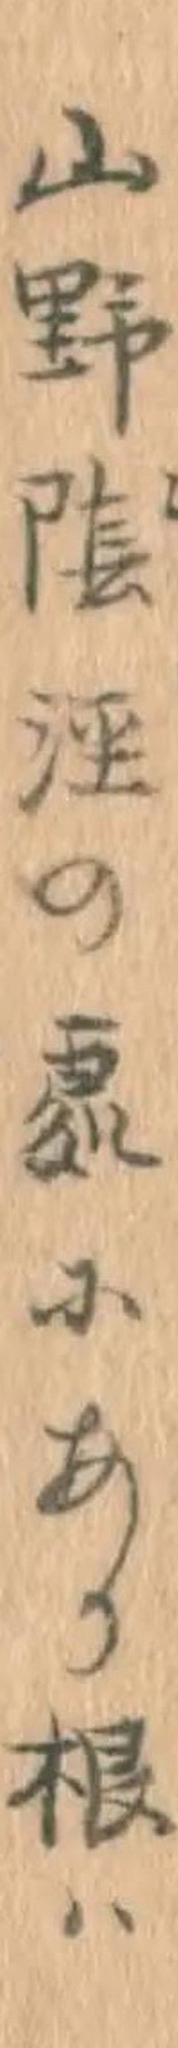山野陰涇の処にあり根は
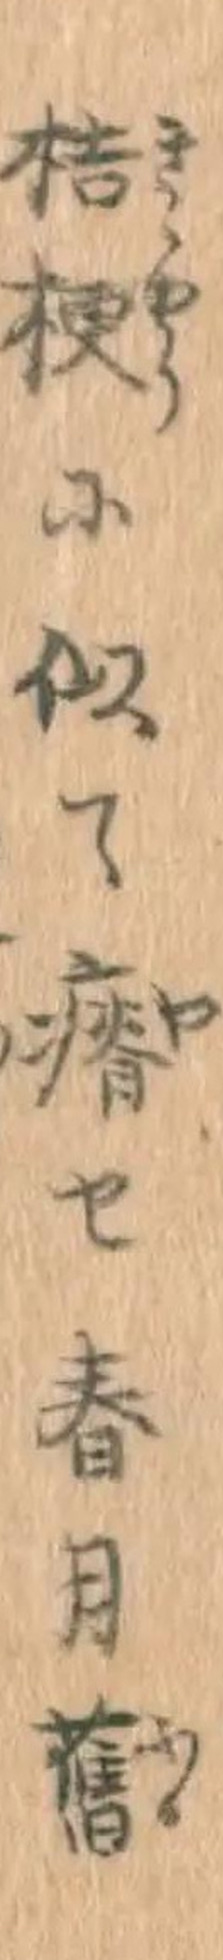桔梗に似て瘠せ春月旧
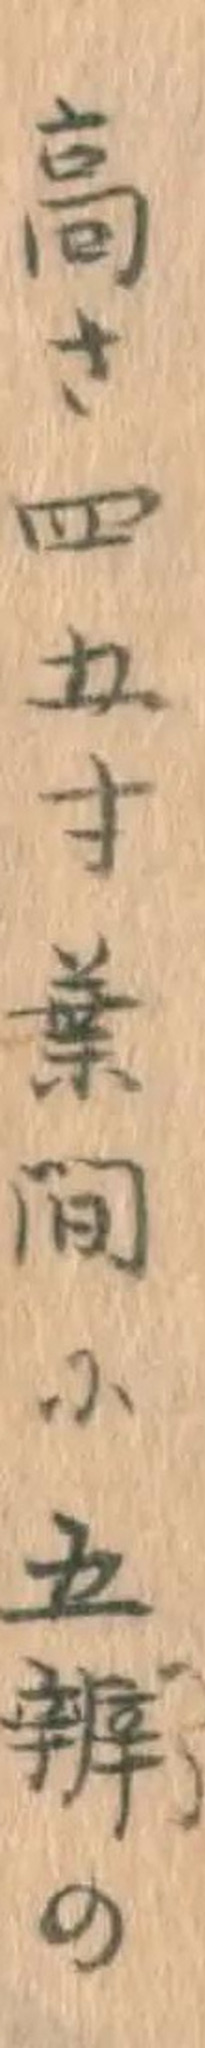高さ四五寸葉間に五弁の
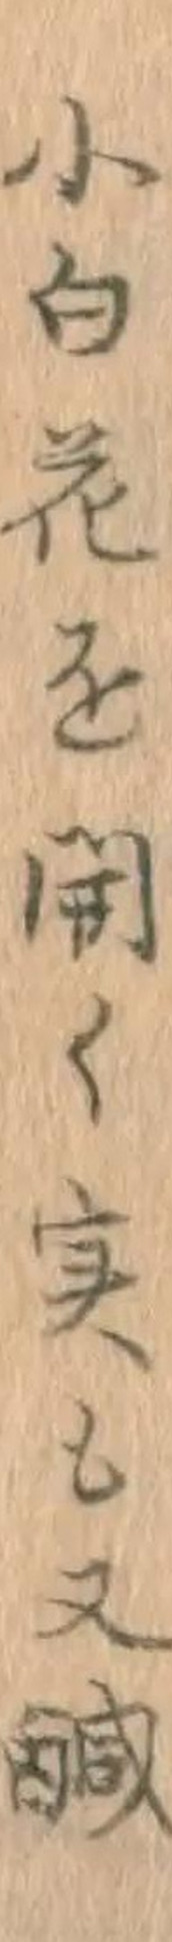小白花を開く実も又鹹
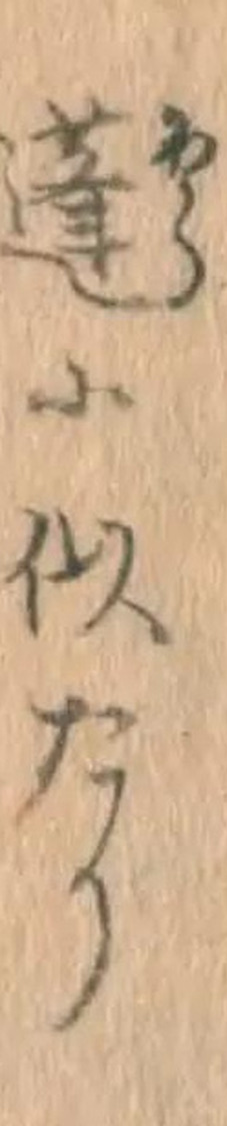蓬に似たり
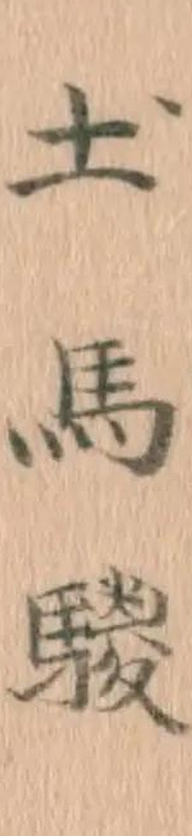土馬騣
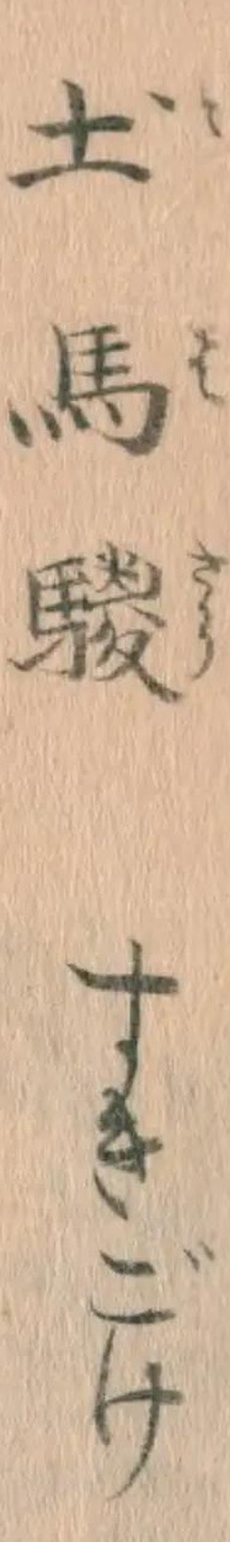土馬騣すきごけ
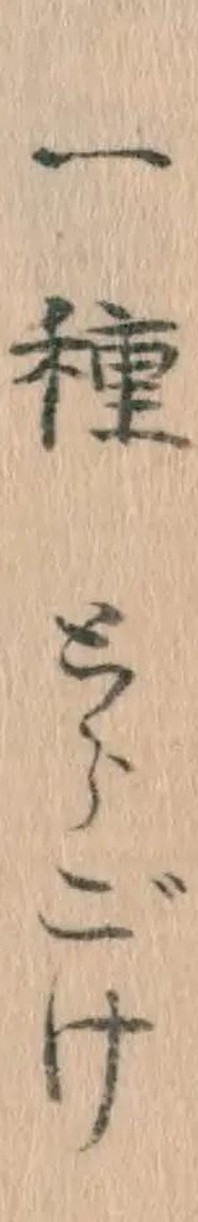一種とらごけ
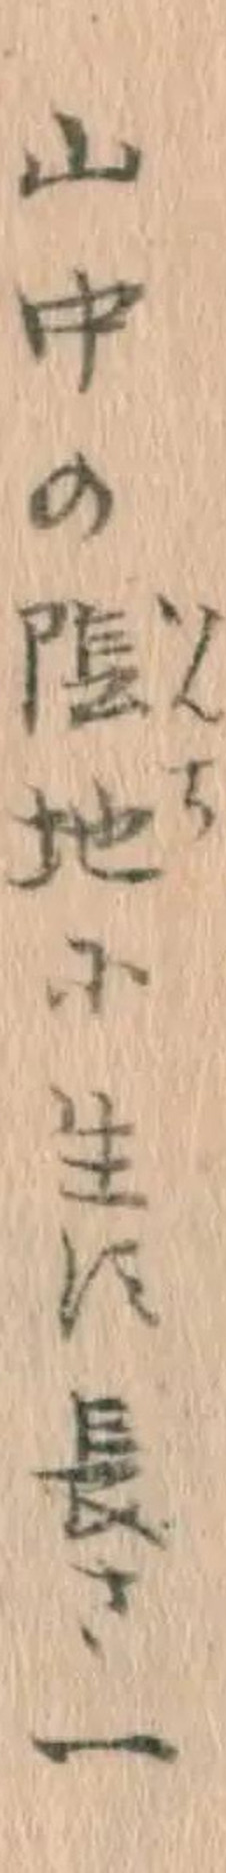山中の陰地に生す長さ一
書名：本草図譜. 巻37-39
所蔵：国立国会図書館 National Diet Library, JAPAN
